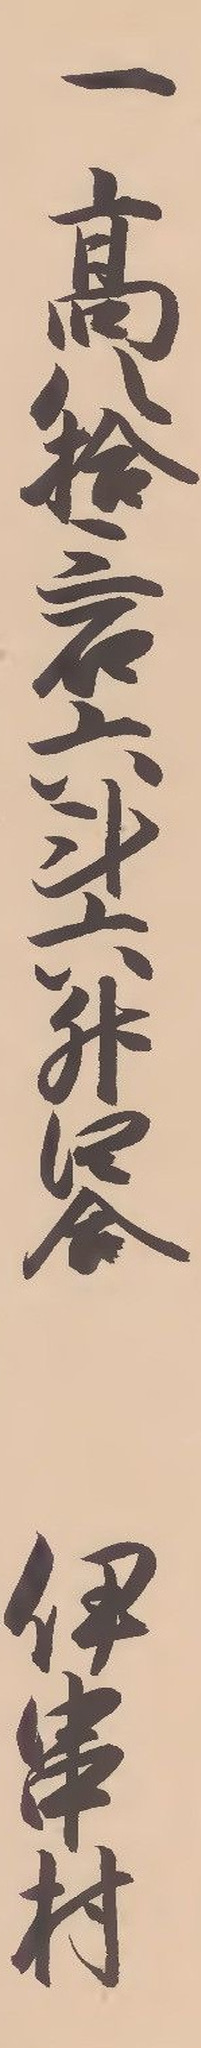一高八拾三石六斗六升四合伊串村
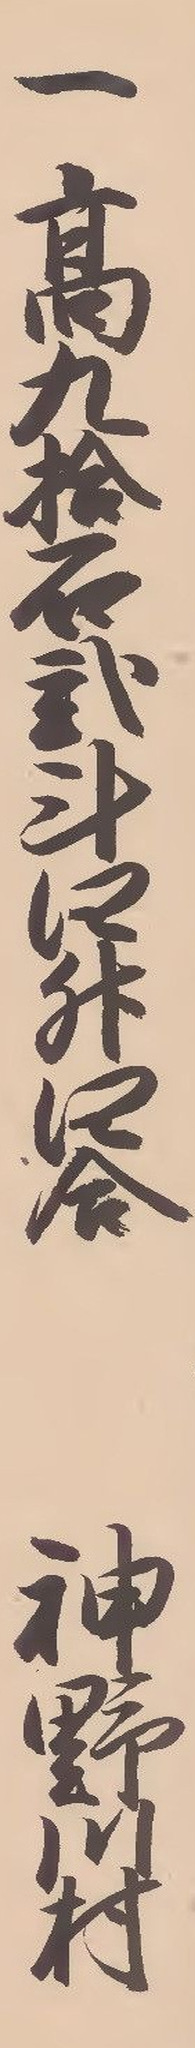一高九拾石弐斗四升四合神野川村
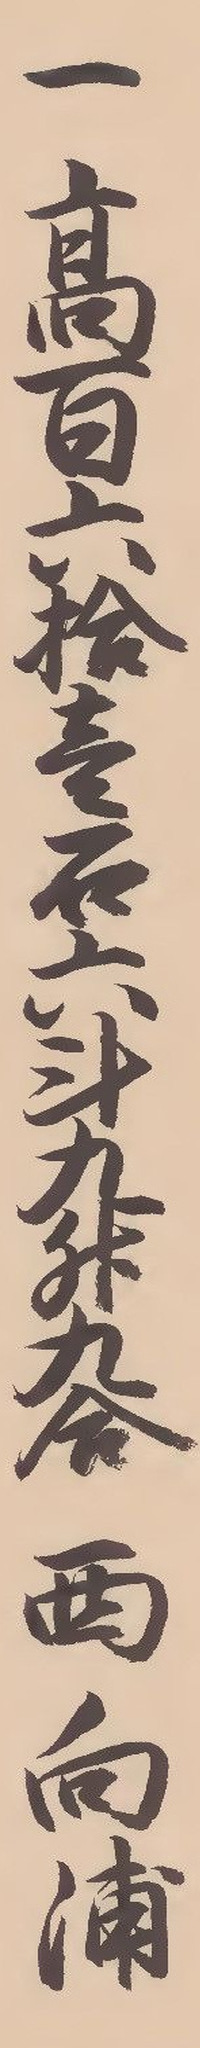一高百六拾壱石六斗九升九合西向浦
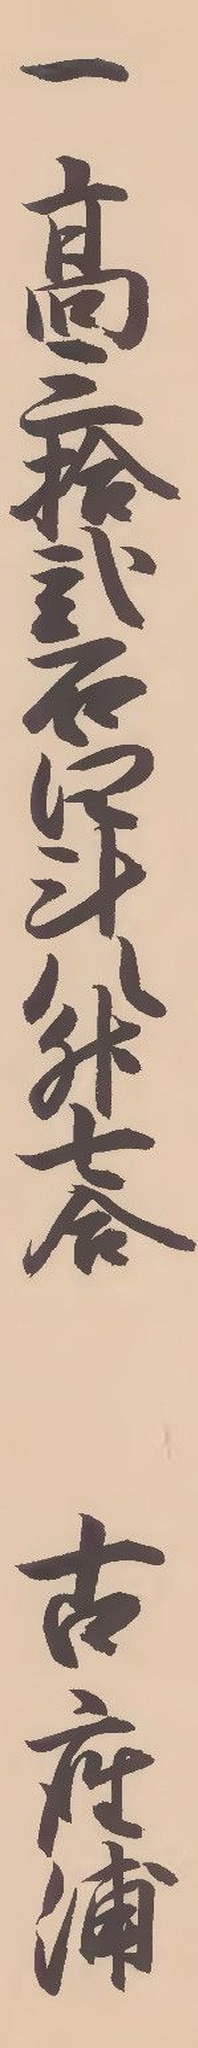一高三拾弐石四斗八升七合古座浦
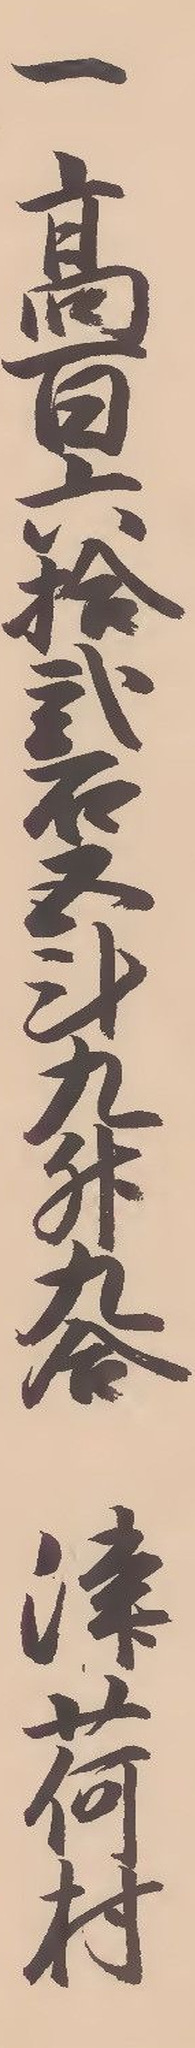一高百六拾弐石五斗九升九合津荷村

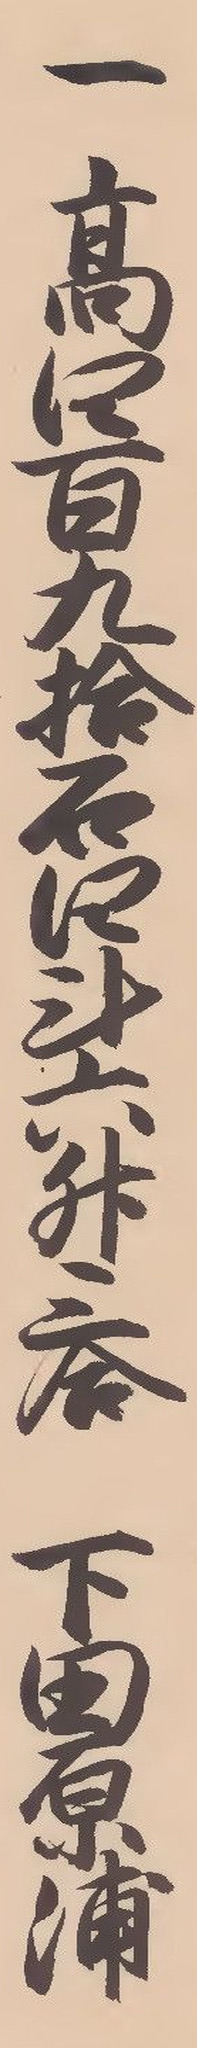一高四百九拾石四斗六升三合下田原浦
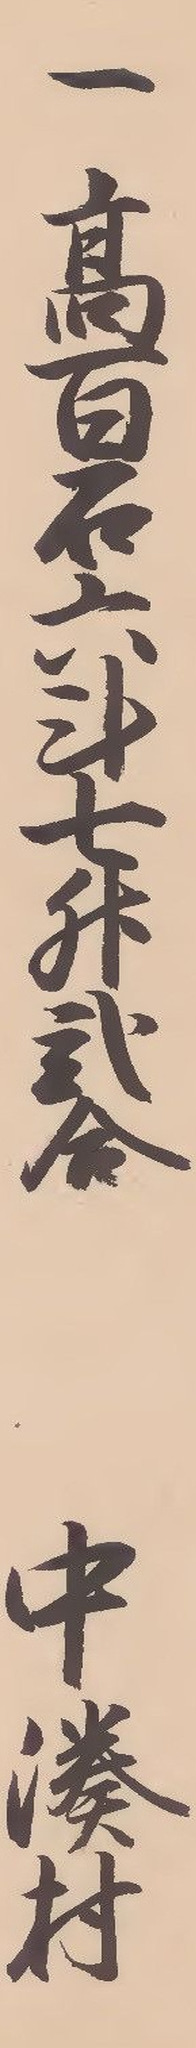一高百石六斗七升弐合中湊村
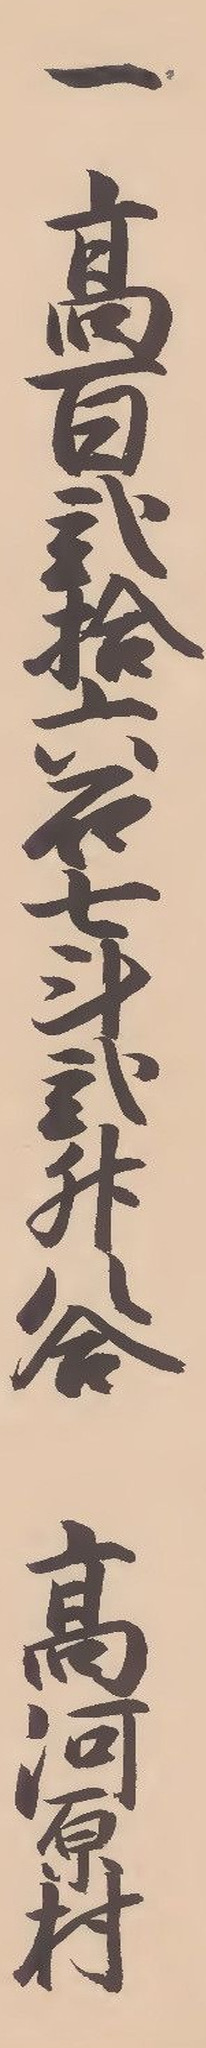一高百弐拾六石七斗弐升八合高河原村
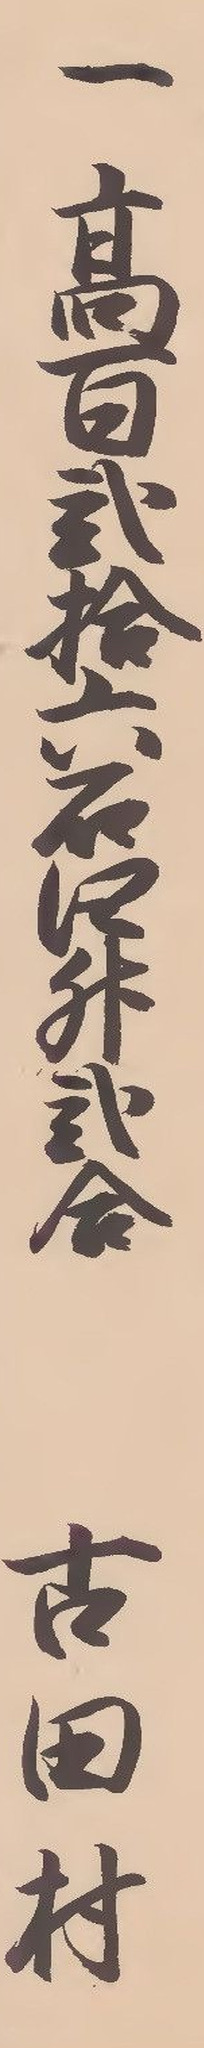一高百弐拾六石四升弐合古田村
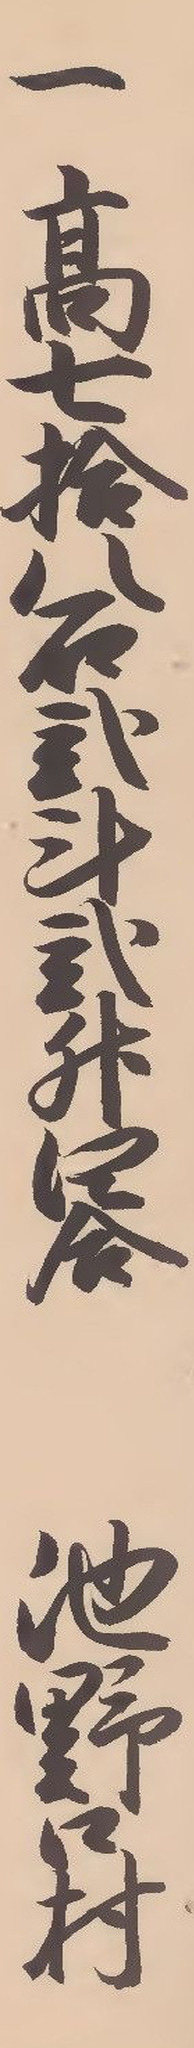一高七拾八石弐斗弐升四合池野口村
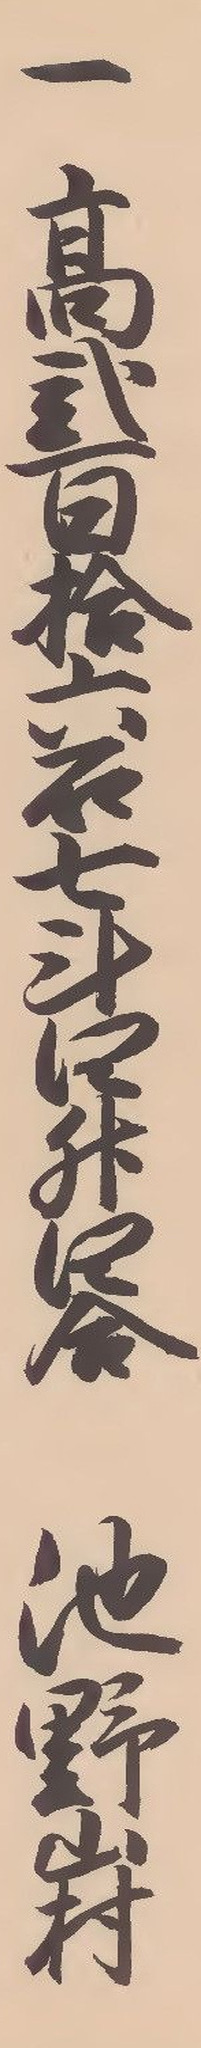一高弐百拾六石七斗四升四合池野山村
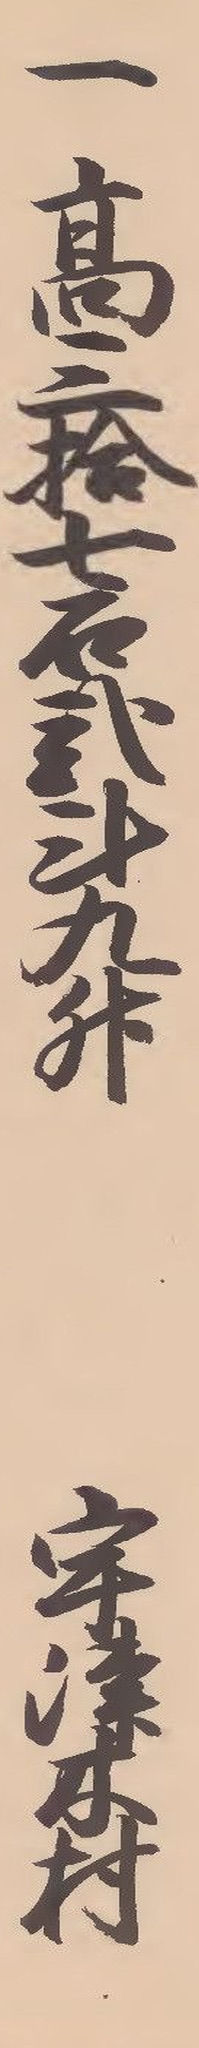一高三拾七石弐斗九升宇津木村

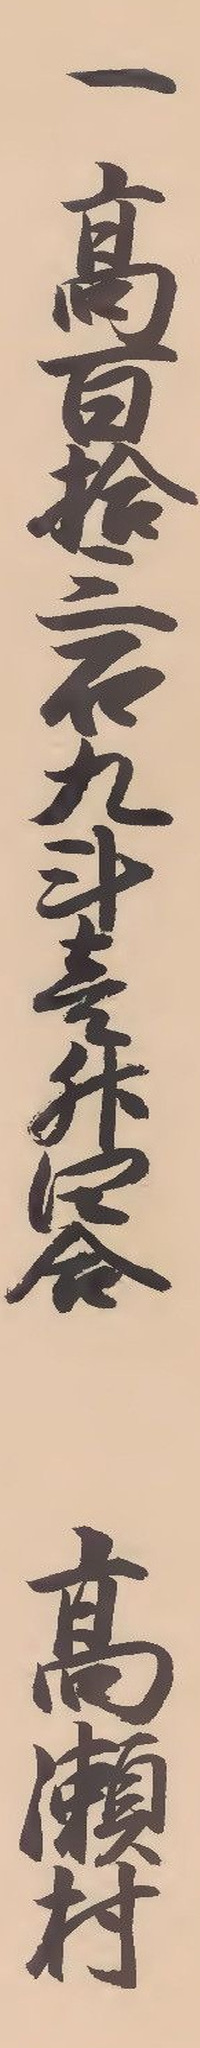一高百拾三石九斗壱升四合高瀬村
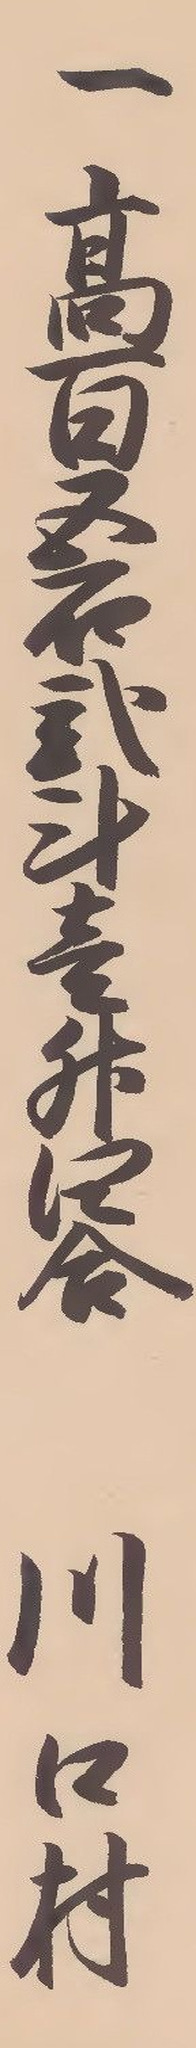一高百五石弐斗壱升四合川口村
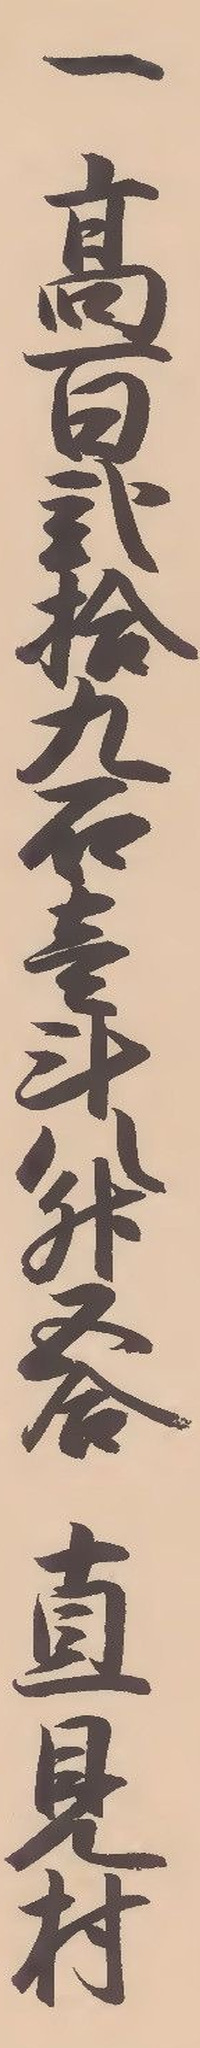一高百弐拾九石壱斗八升五合直見村
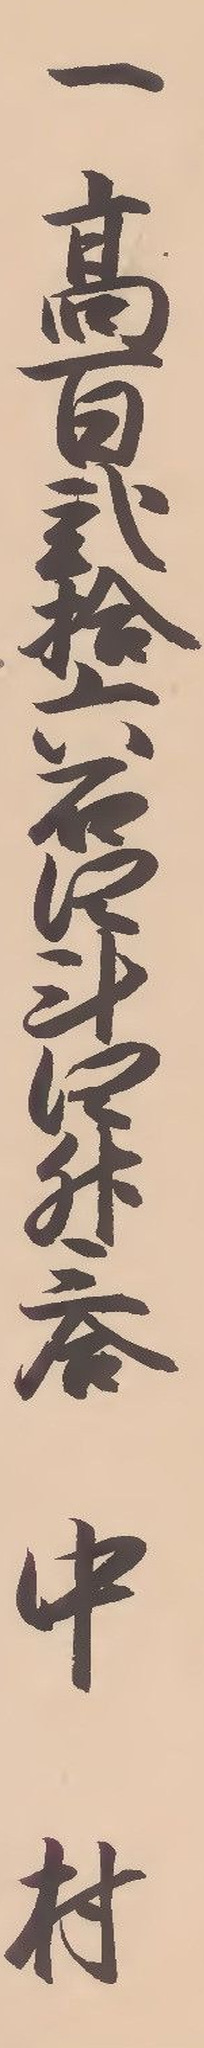一高百弐拾六石四斗四升三合中村
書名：紀伊国郷帳
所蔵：国立公文書館 National Archives of Japan
